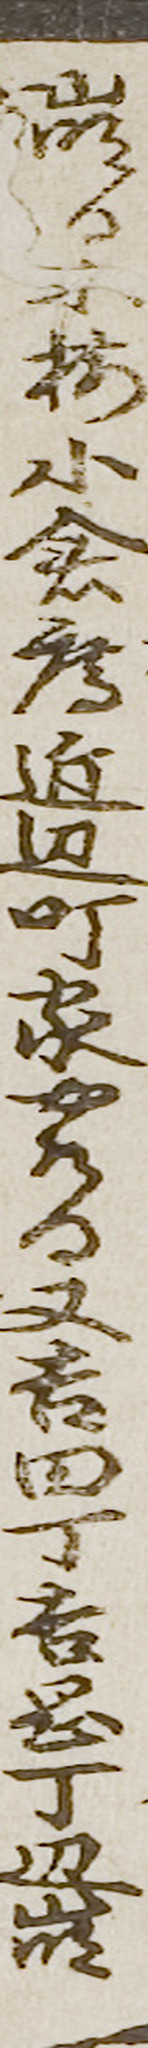崩る小梅小倉庵近辺町家やける又吉田丁吉岡丁辺崩
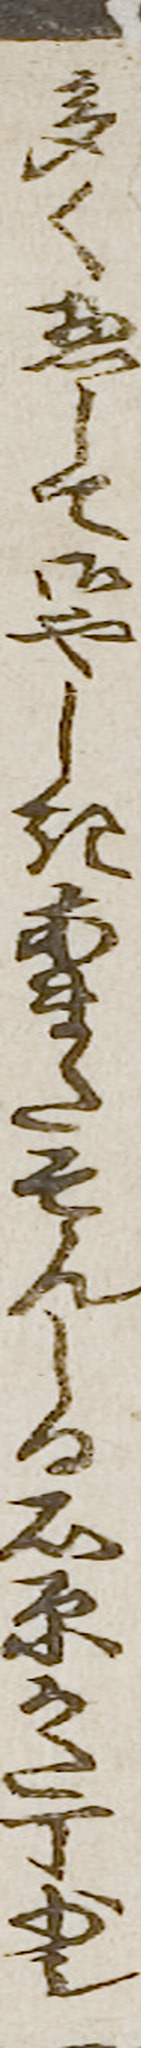多く惣して御やしきあまたそんしる石原かた丁少シ
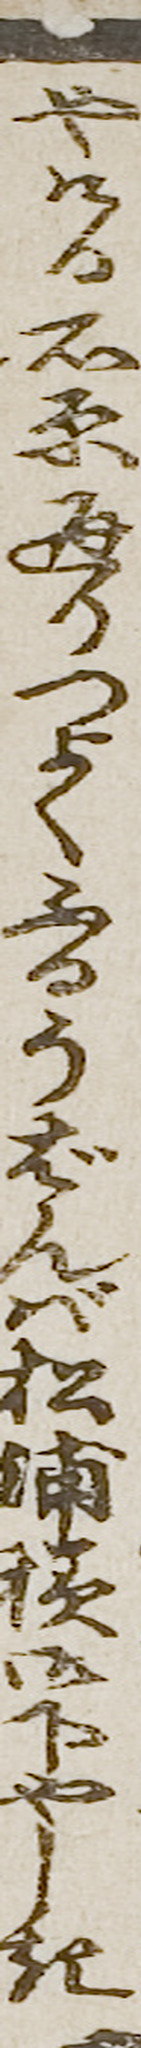やける石原通りつよくふるうばんば松浦様御下やしき
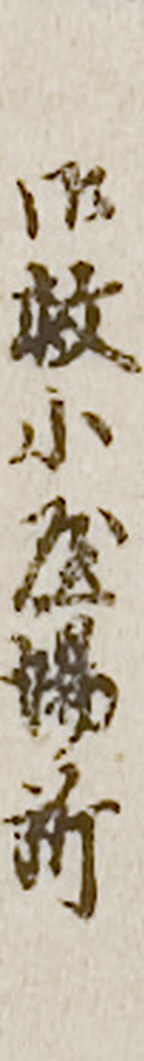御救小屋場所
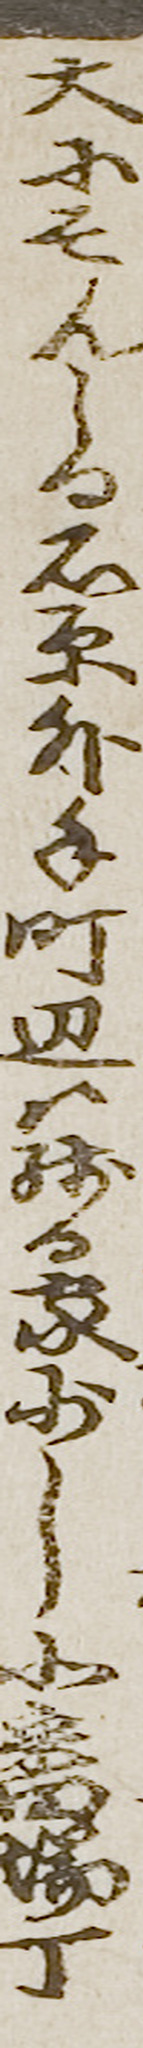大にそんしる石原外手町辺は残る家少し北番場丁
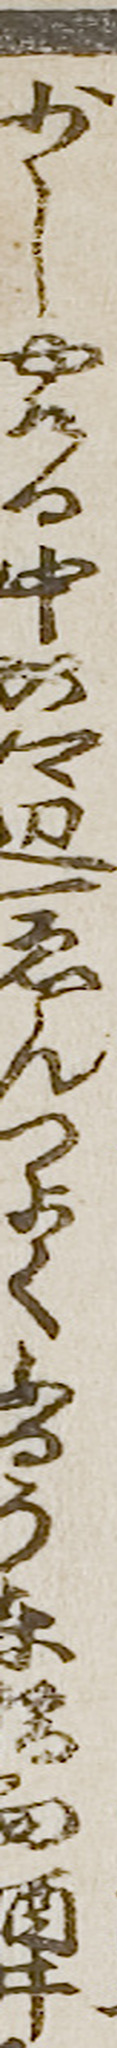少しやける中の郷辺一ゑんつよくふるう東橋向酒井下野
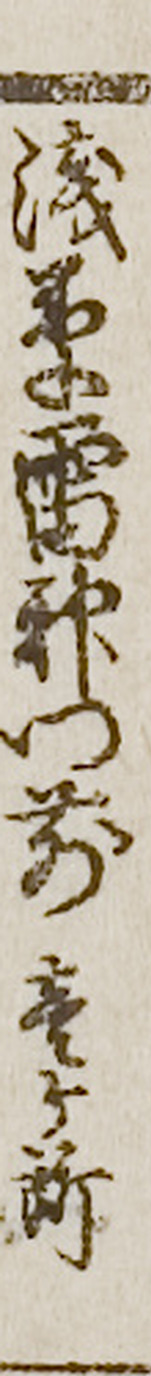浅草雷神門前壱ケ所
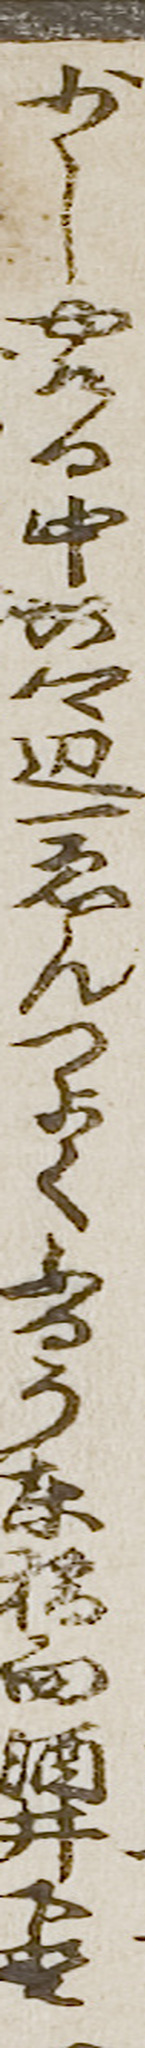少しやける中の郷辺一ゑんつよくふるう東橋向酒井下野
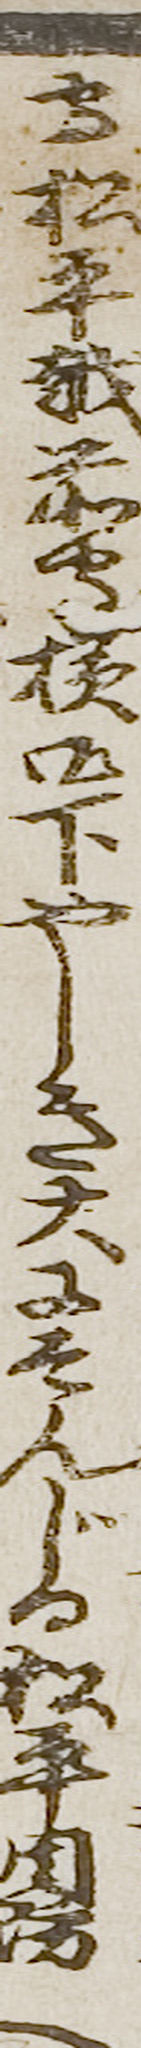守松平越前守様御下やしき大にそんじる松平周防
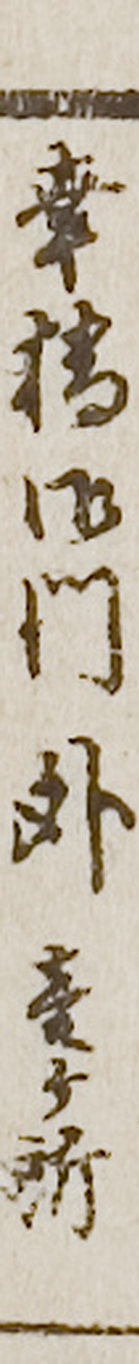幸橋御門外壱ケ所
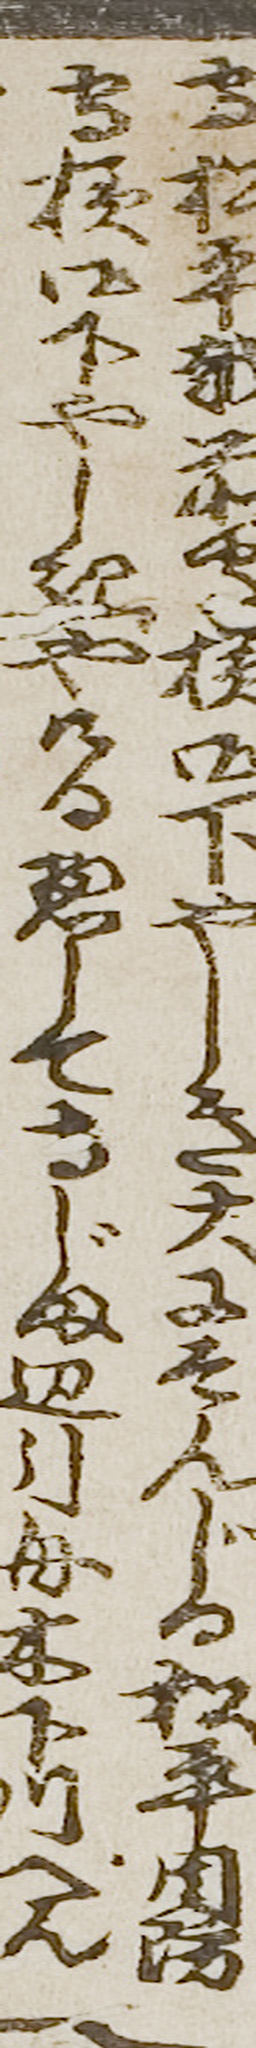守様御下やしきやける惣して寺じま辺引舟木下川へん
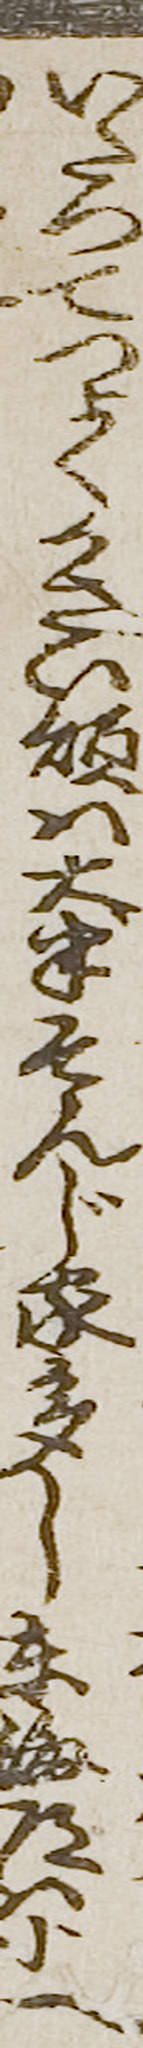いたつてつよくかさい類は大半そんじ家多し東海道は小
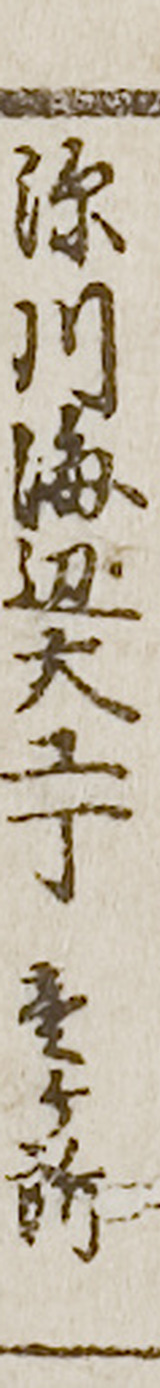深川海辺大工丁壱ケ所
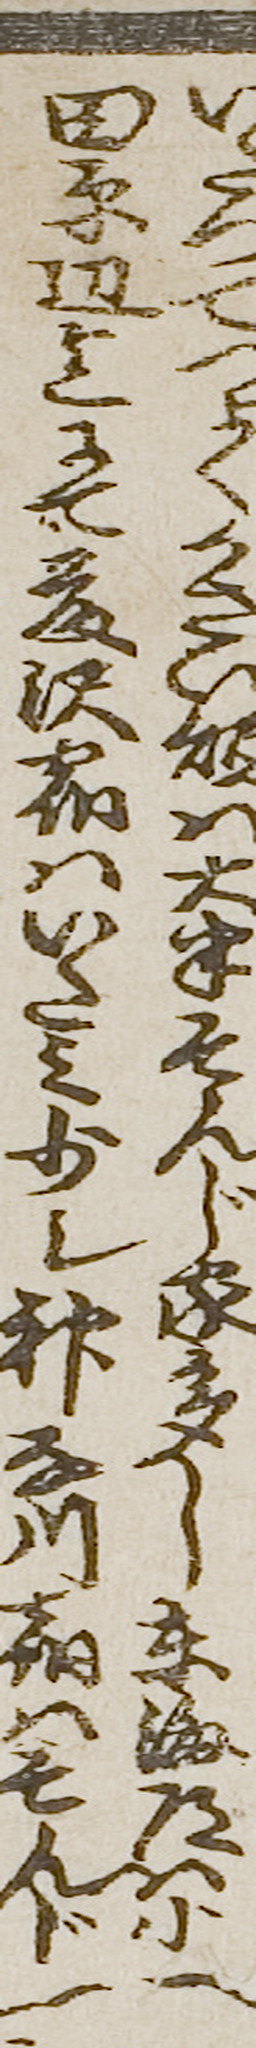田原辺迄にて藤沢宿はいたみ少シ神な川宿はそんじ
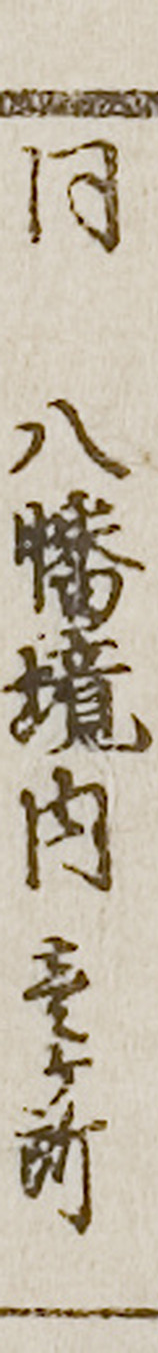同八幡境内壱ケ所
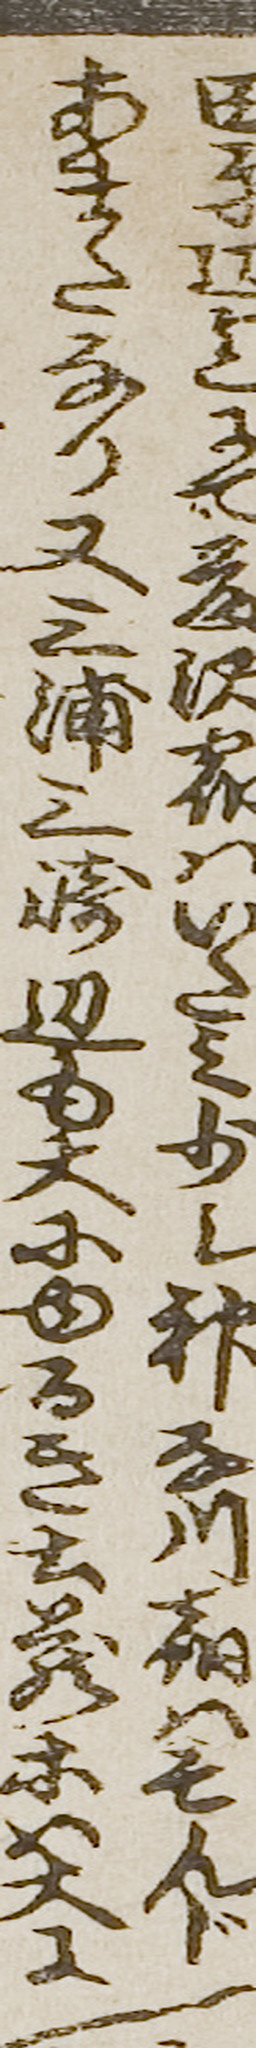あまたなり又三浦三崎辺も大にゆるき土蔵等は大に
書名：安政改正泰平盤石図会
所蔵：東京大学総合図書館 General Library in the University of Tokyo, JAPAN
